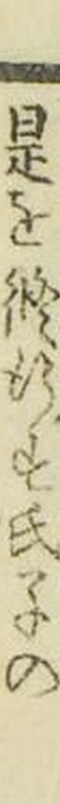是を修行す氏子の
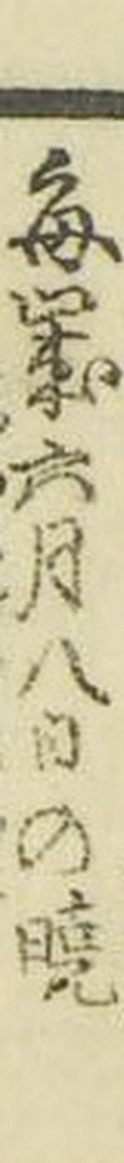毎歳六月八日の暁
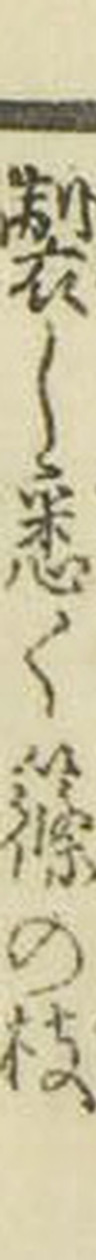製し悉く篠の枝
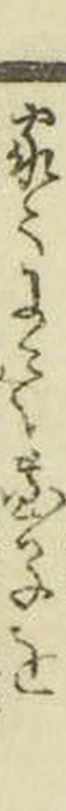家々にて団子を
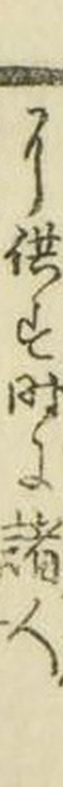に供す時に諸人
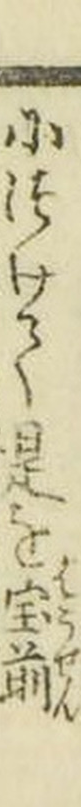につけて是を宝前
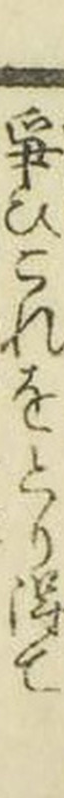争ひこれをとり得て
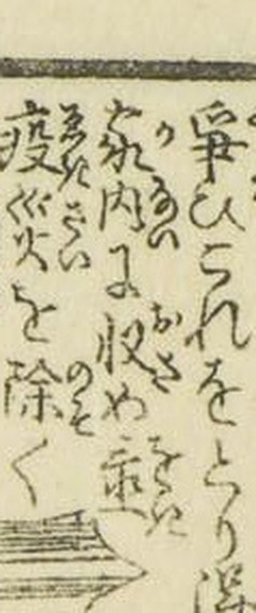家内に収め置
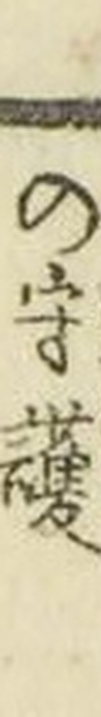の守護
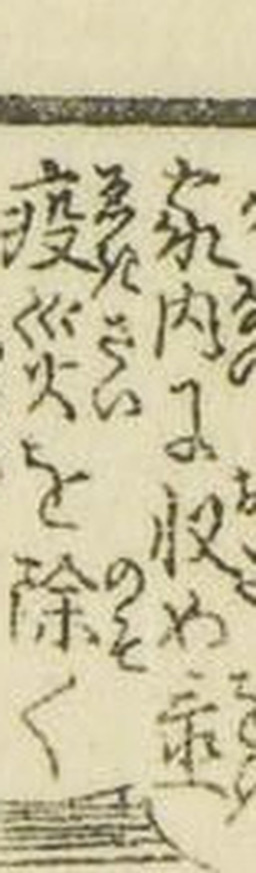疫災を除く
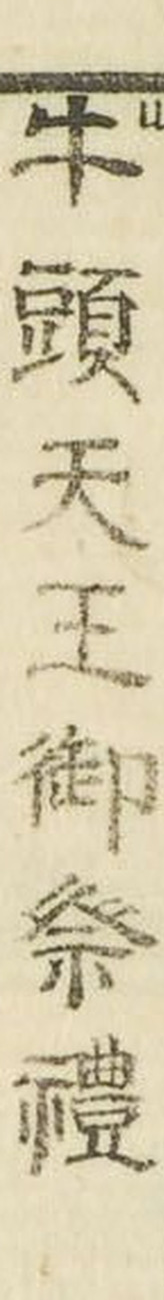牛頭天王御祭禮

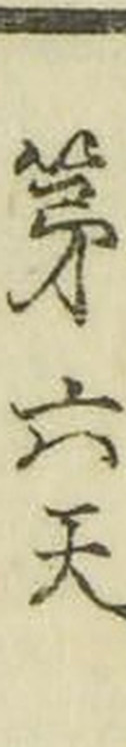第六天
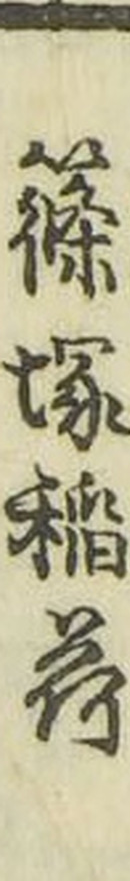篠塚稲荷
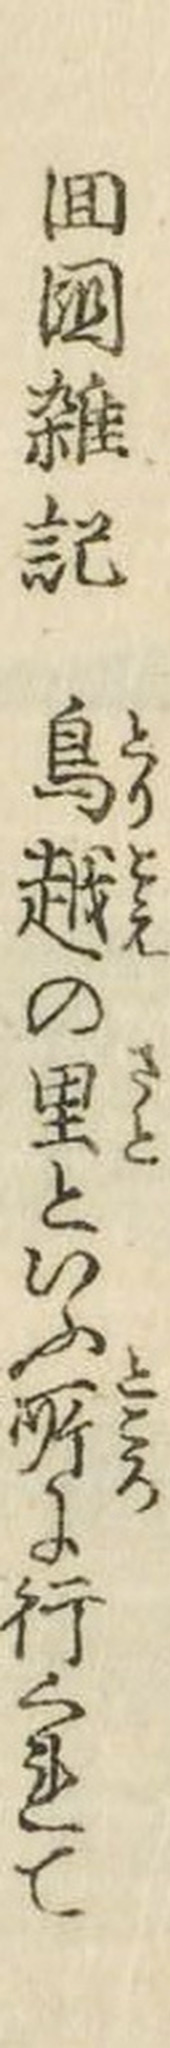四国雑記鳥越の里といふ所に行くれて
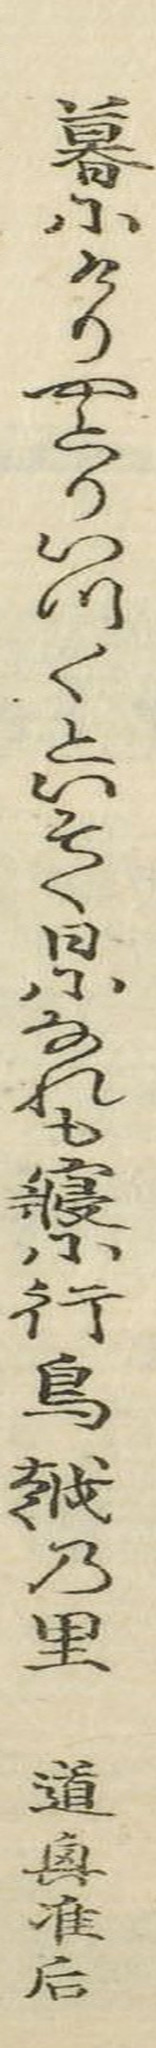暮にけりやとりいつくといそく日になれも寝に行鳥越乃里道奥准后
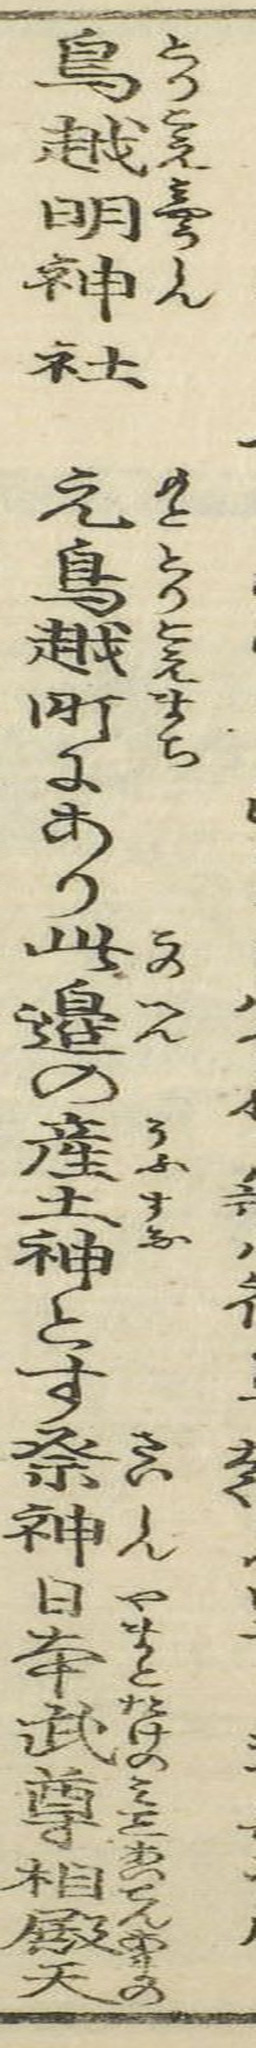鳥越明神社元鳥越町にあり此辺の産土神とす祭神日本武尊相殿天
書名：江戸名所図会 20巻 巻之16
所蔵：東京学芸大学教育コンテンツアーカイブ
